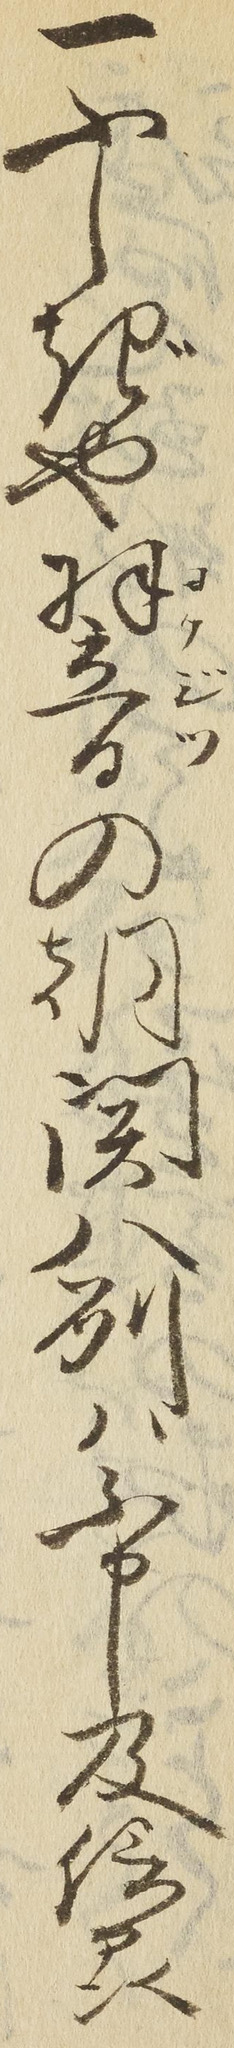一ふしぎや翌日の朝関八洲は不申及信州
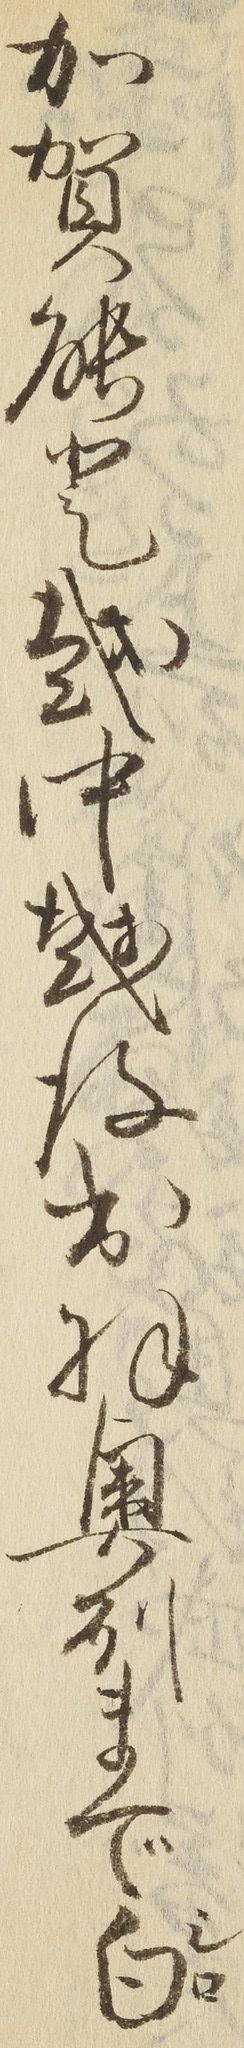加賀能登越中越後出羽奥州まで白
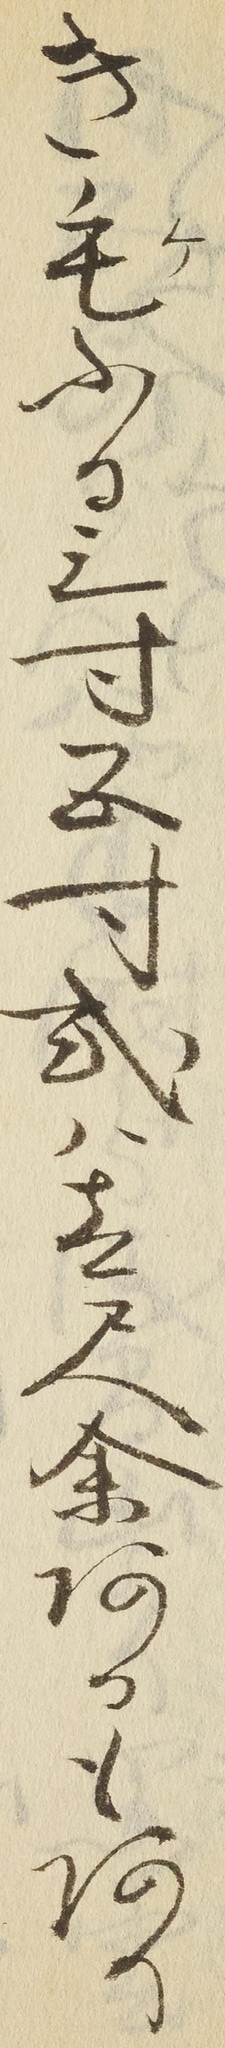き毛ふる三寸五寸或は壱尺余あるもあり
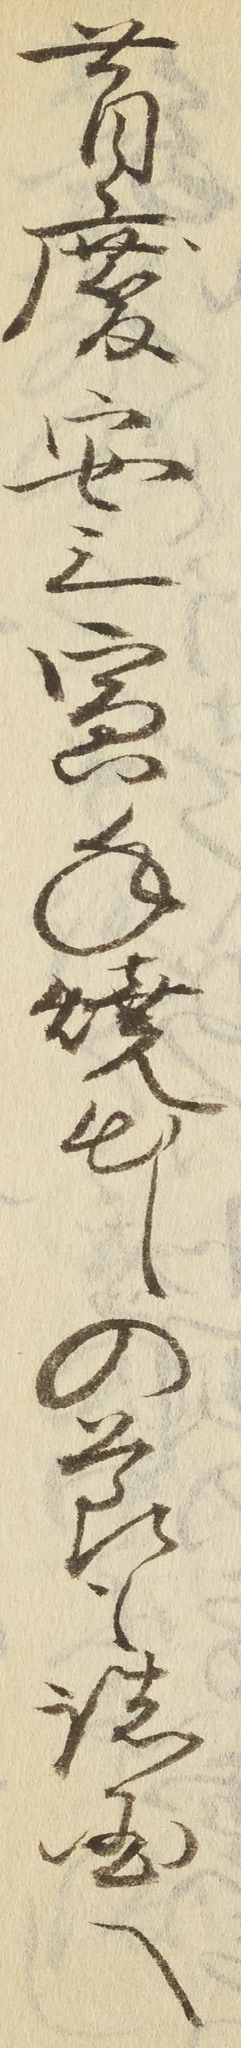昔慶安三寅年焼出しの節も諸国へ
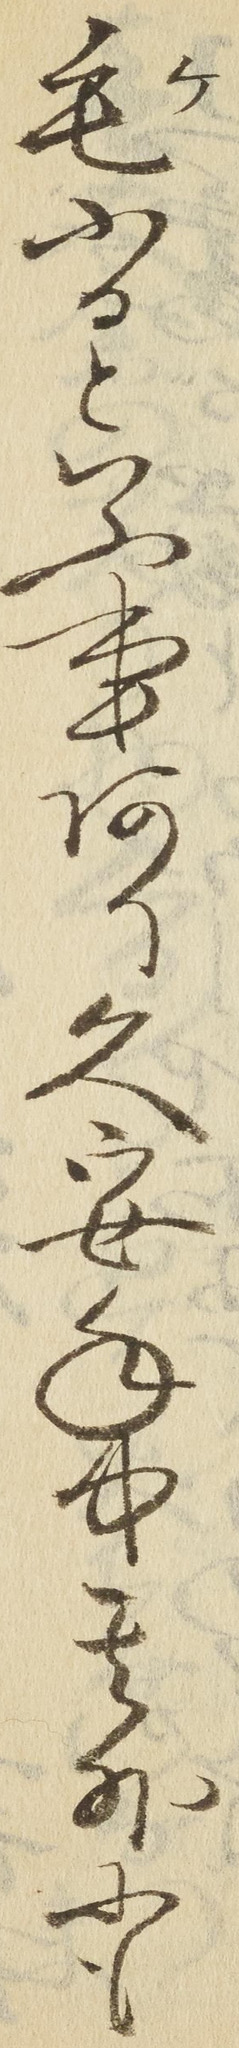毛ふるといふ事あり久安年中其外にも
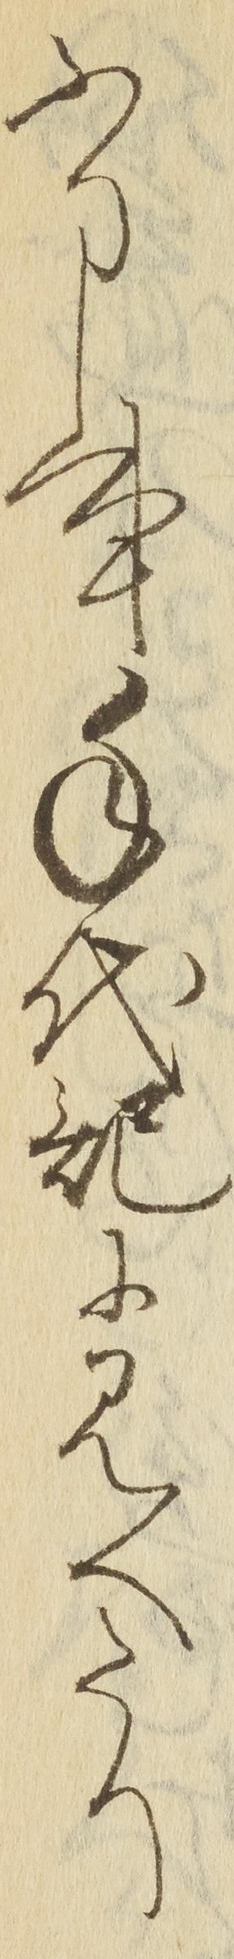ふる事年代記に見へたり
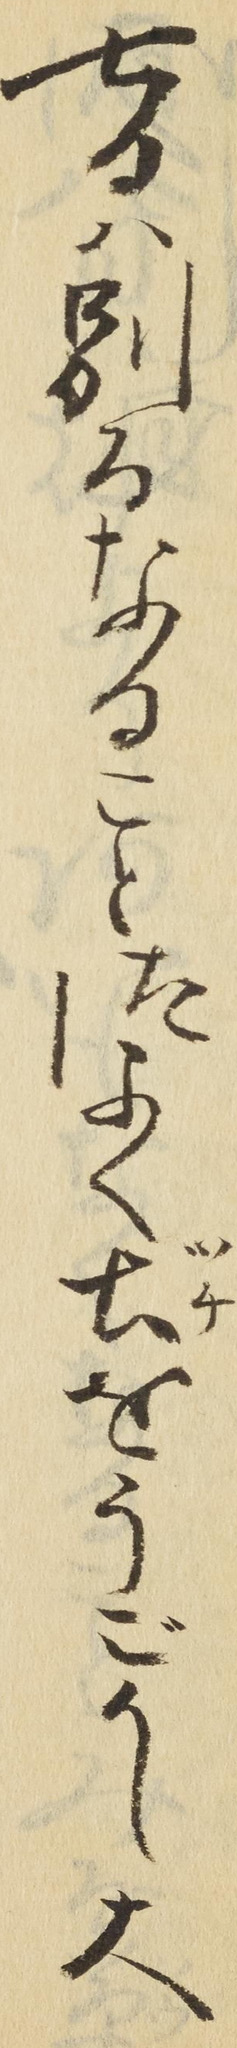七日は別而なることつよく土をうごかし大
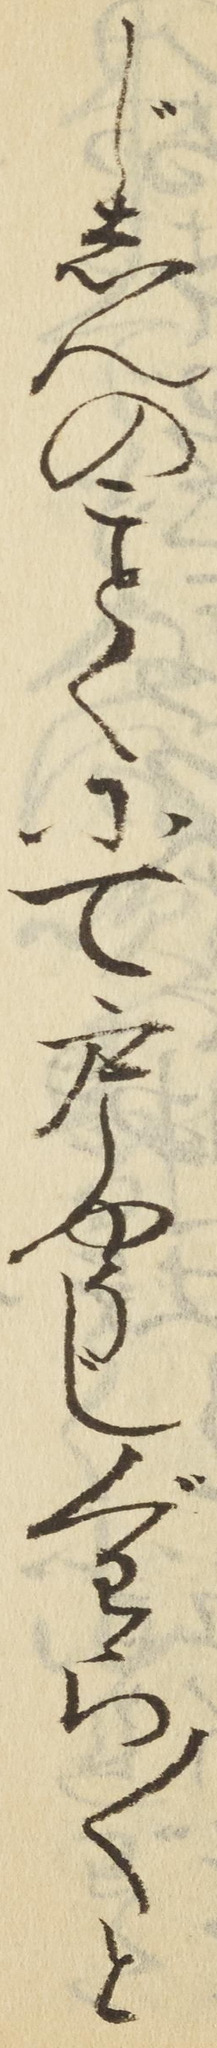じしんのことくにて戸しゃうしくら〳〵と
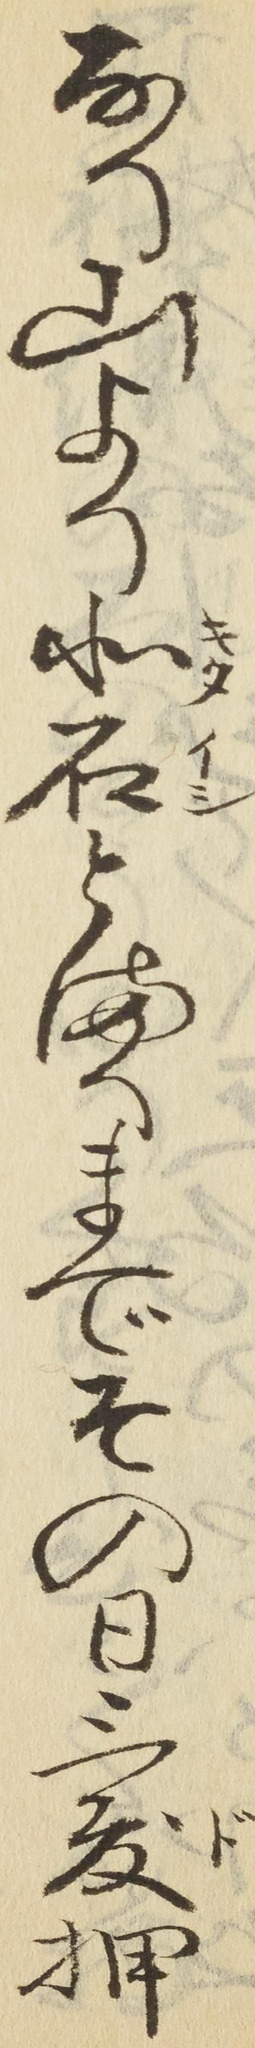なり山より北石とまりまで三度押
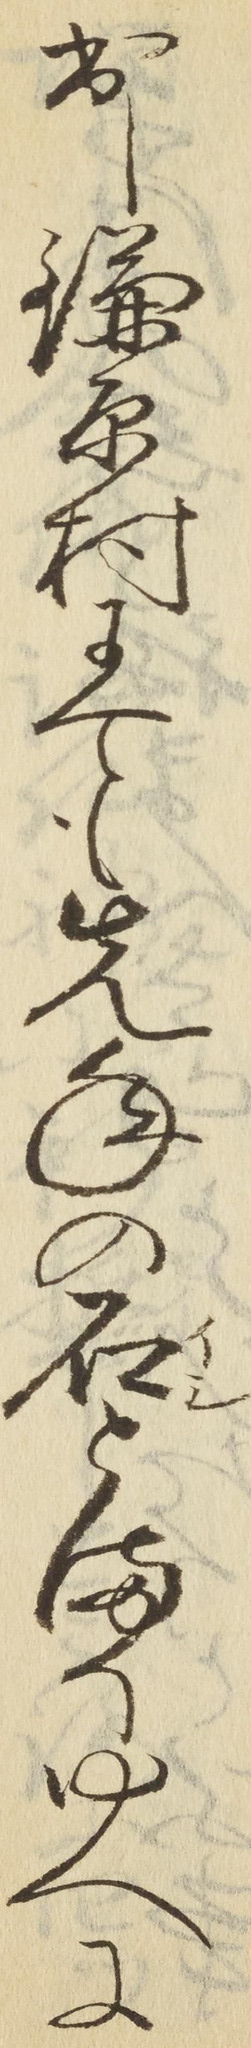出し鎌原村にて先年の石とまりゆへに
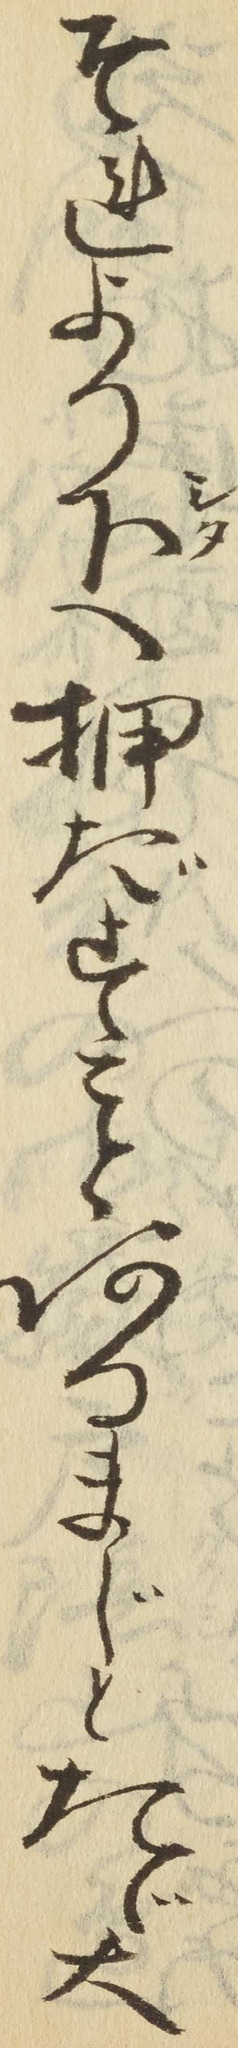それより下へ押たすことあるまじとたゞ大
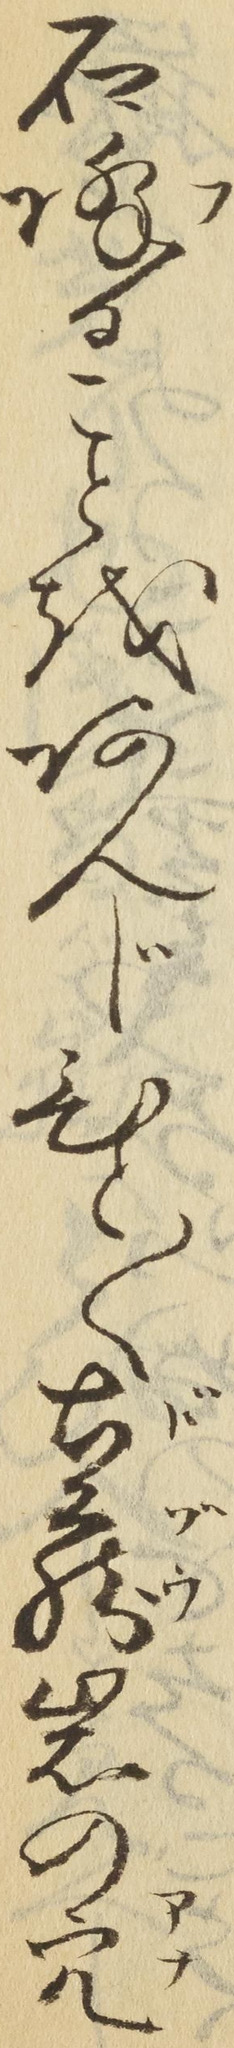石降ることをあんじひく〳〵土蔵岩の穴
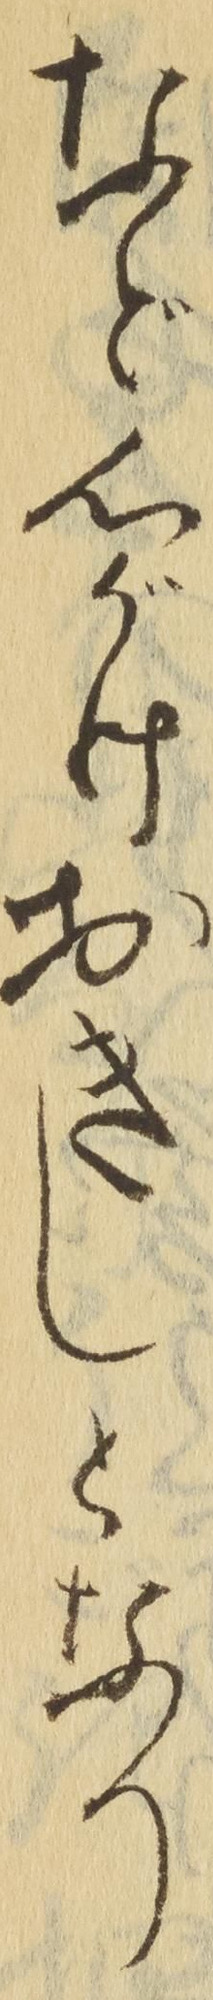など心かけおきしとなり

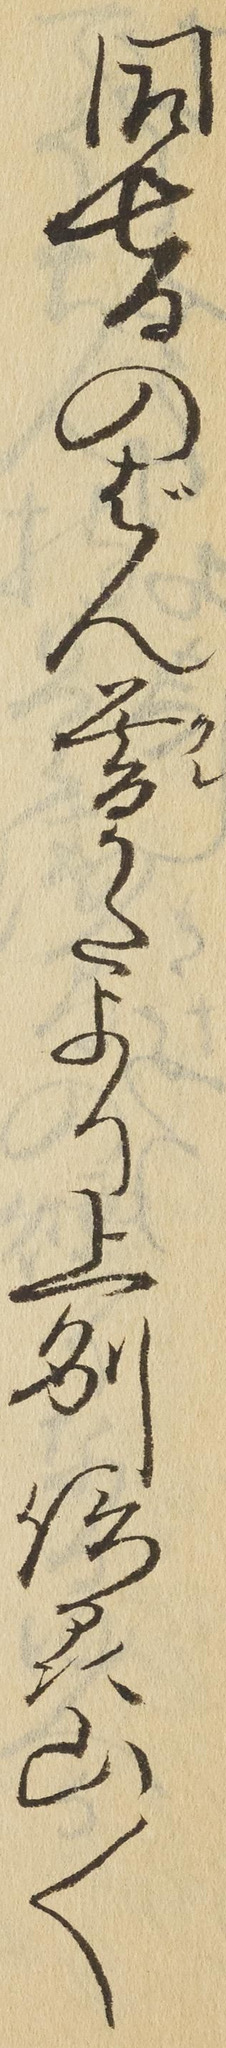同七日のばん暮かたより上州信州山〳〵
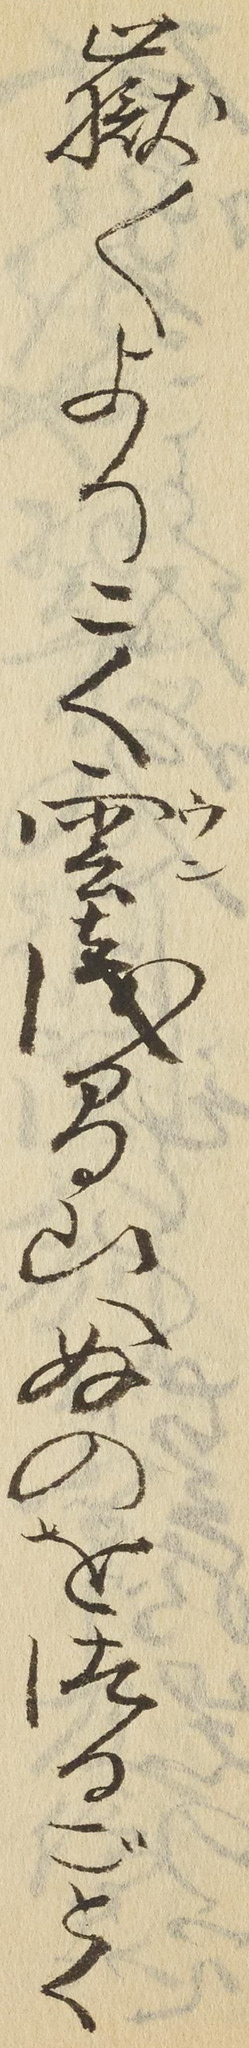嶽〳〵よりこく雲浅間山へぬのをつるごとく
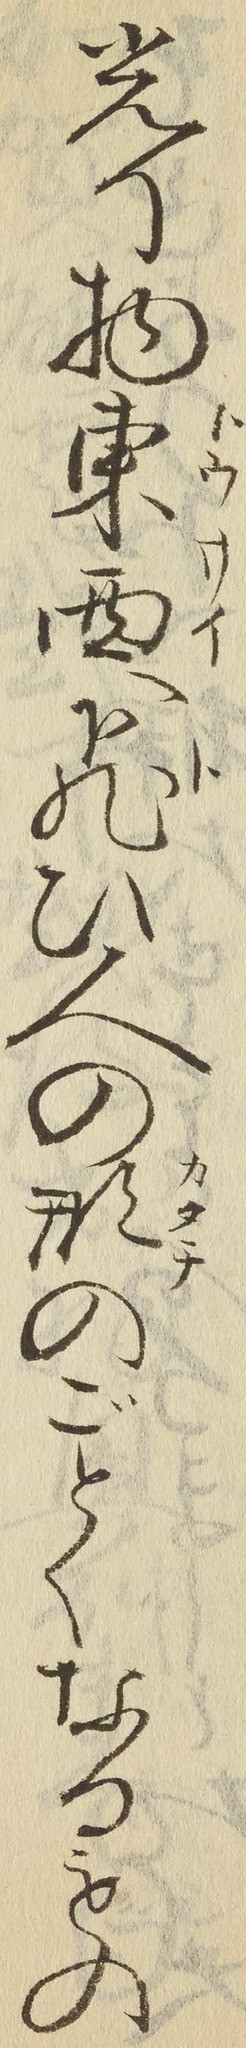光り物東西飛ひ人の形のごとくなるもの
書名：浅間大變記
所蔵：東京大学地震研究所図書室 Earthquake Research Institute Library, The University of Tokyo, JAPAN
